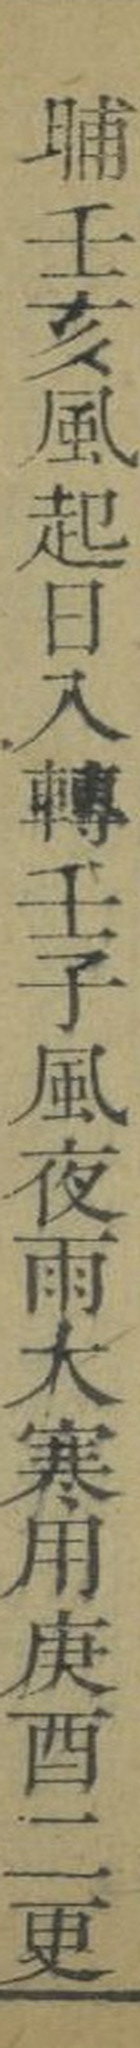晡壬亥風起日入轉壬子風夜雨大寒用庚酉二更
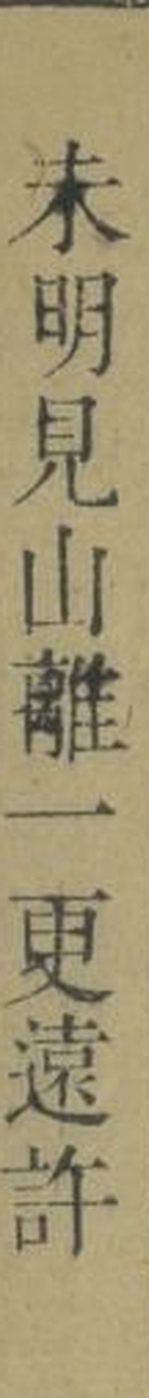未明見山離一更遠許
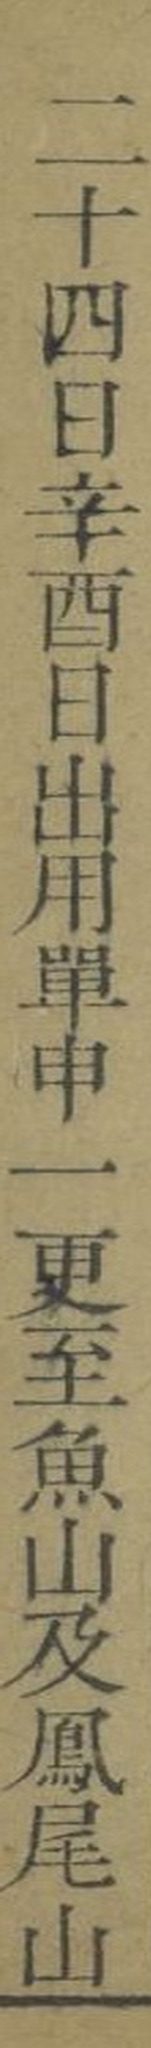二十四日辛酉日出用單申一更至魚山及鳳尾山

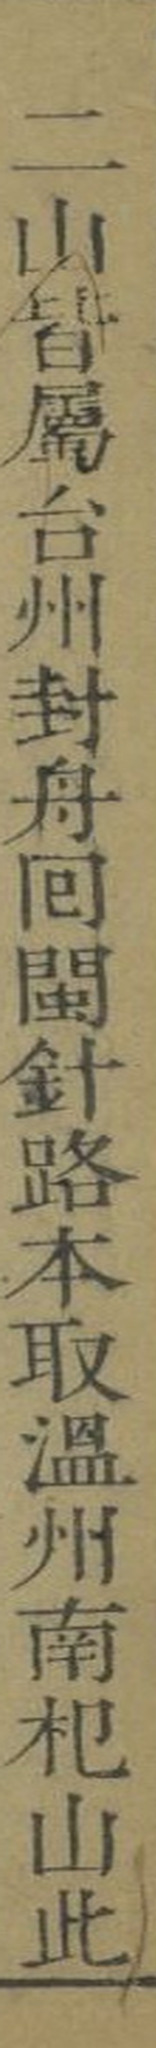二山皆屬台州封舟囘閩針路本取溫州南杞山此
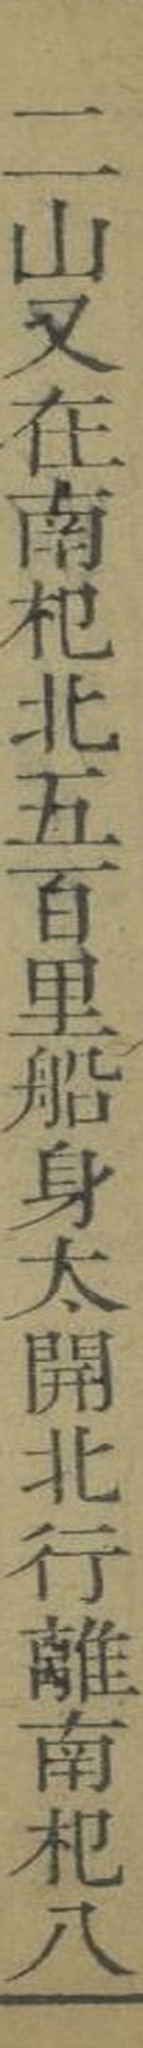二山又在南杞北五百里船身太開北行離南杞八
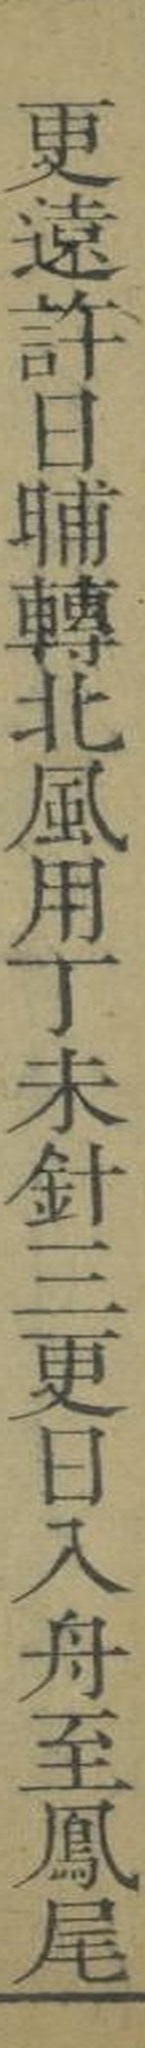更遠許日晡轉北風用丁未針三更日入舟至鳳尾
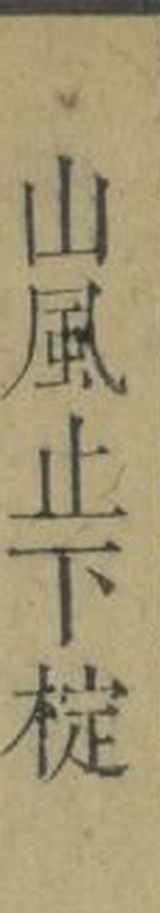山風止下椗
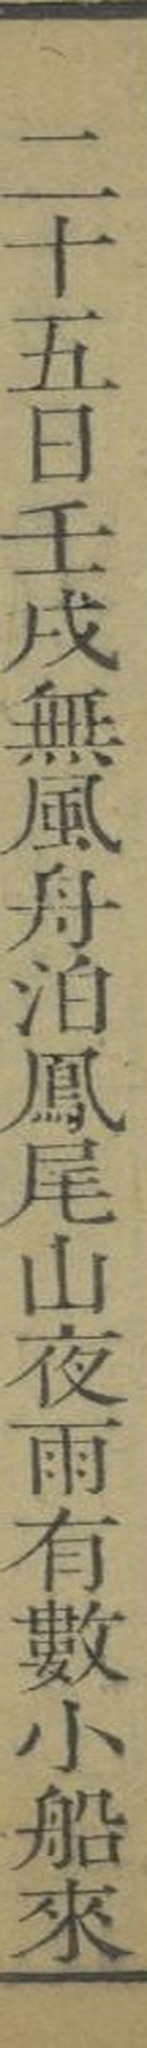二十五日壬戌無風舟泊鳳尾山夜雨有數小船來
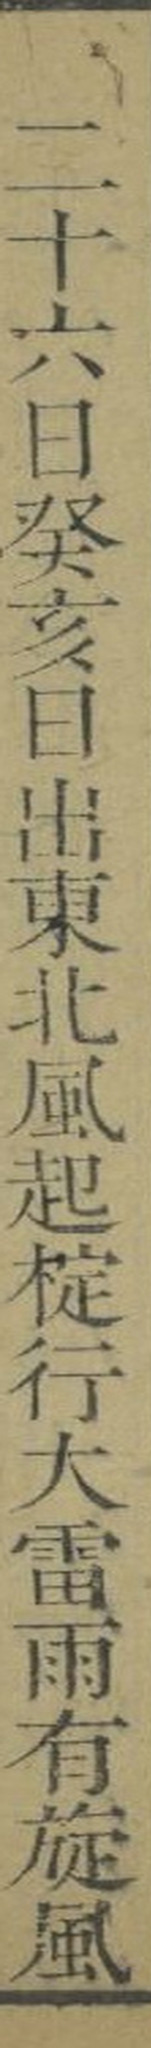二十六日癸亥日出東北風起椗行大雷雨有旋風
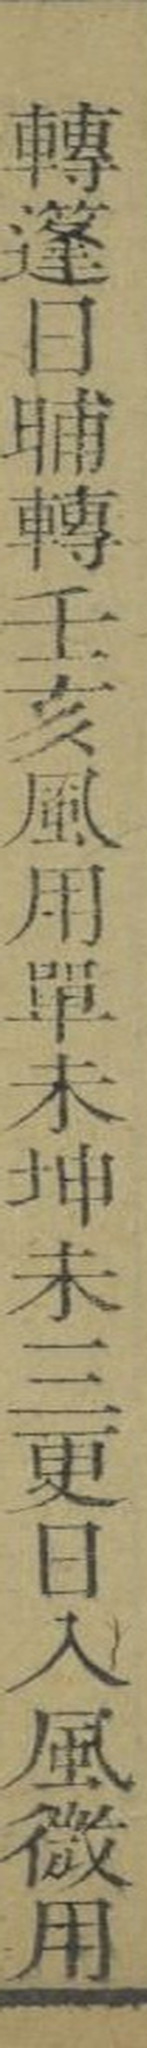轉篷日晡轉壬亥風用單未坤未三更日入風微用
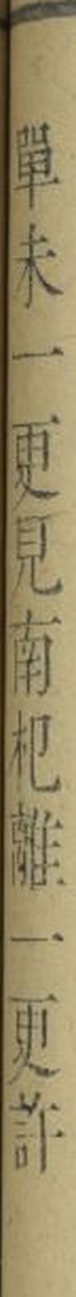單未一更見南杞離一更許
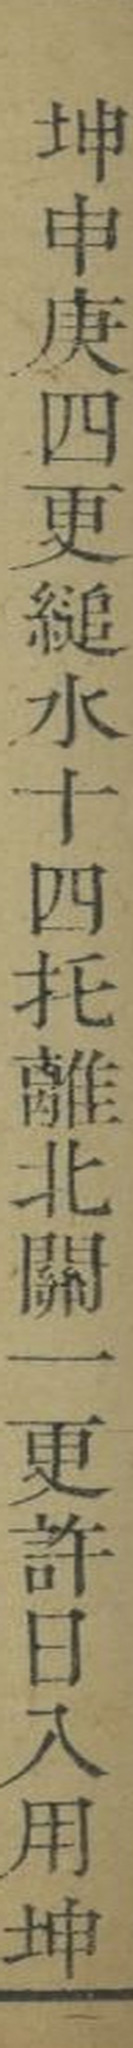坤申庚四更縋水十四托離北關一更許日入用坤
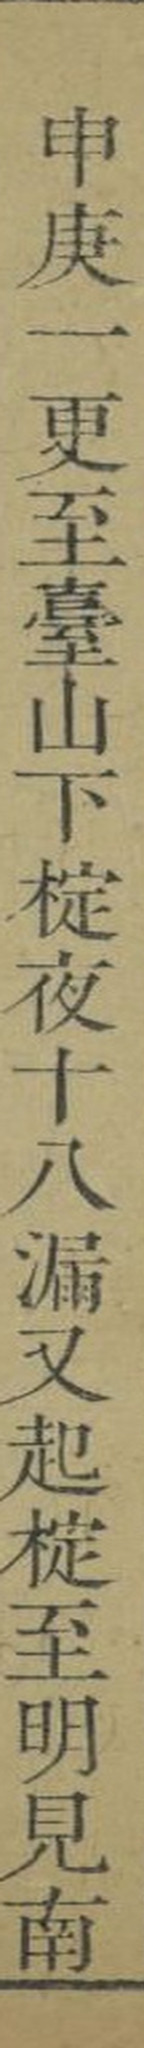申庚一更至臺山下椗夜十八漏又起椗至明見南
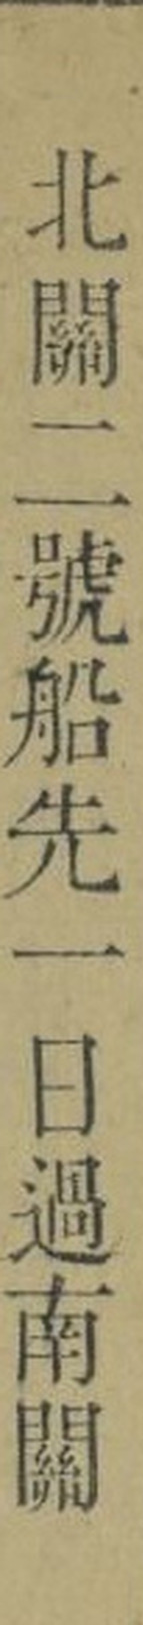北關二號船先一日過南關
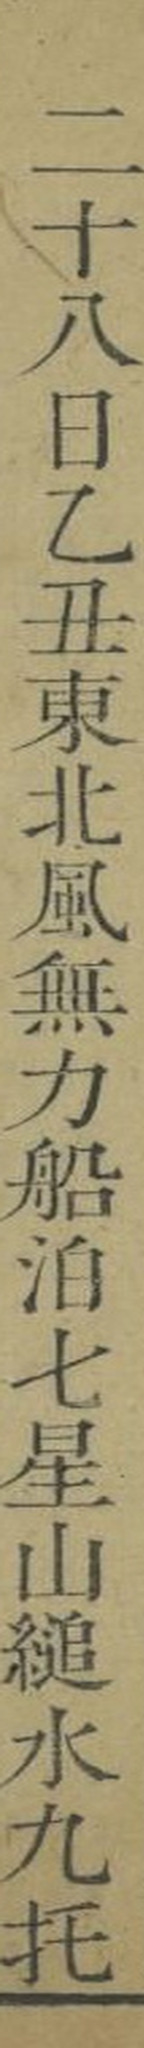二十八日乙丑東北風無力船泊七星山縋水九托
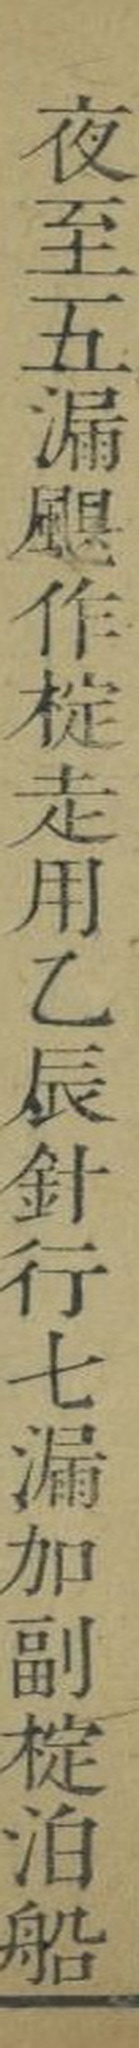夜至五漏颶作椗走用乙辰針行七漏加副椗泊船
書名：中山伝信録 巻一
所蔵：University of the Ryukyus Library
